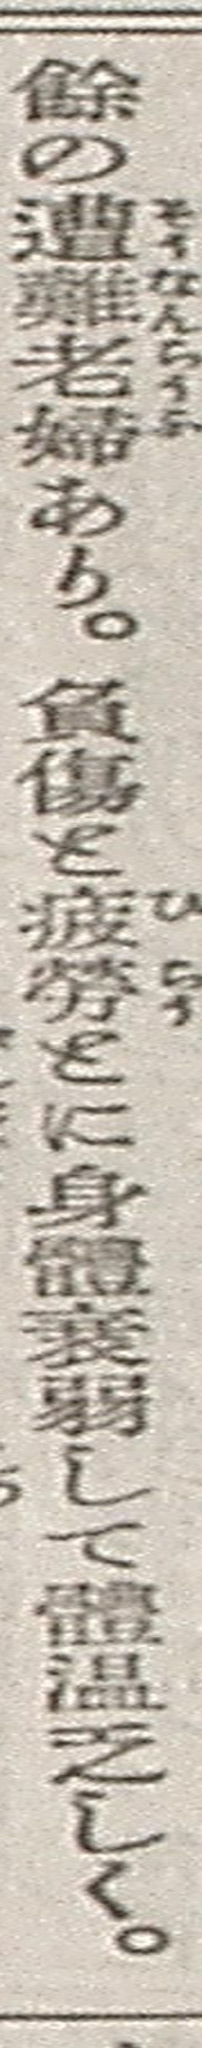余の遭難老婦あり。負傷と疲労とに身体衰弱して体温乏しく。
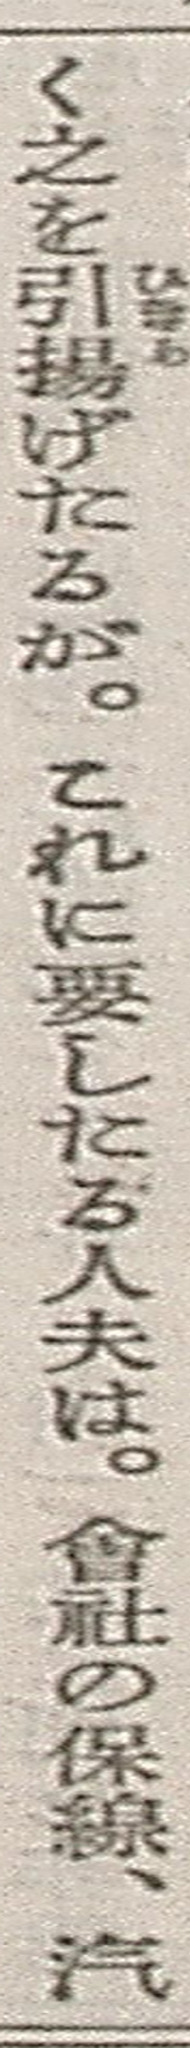く之を引揚げたるが。これに要したる人夫は。会社の保線、汽
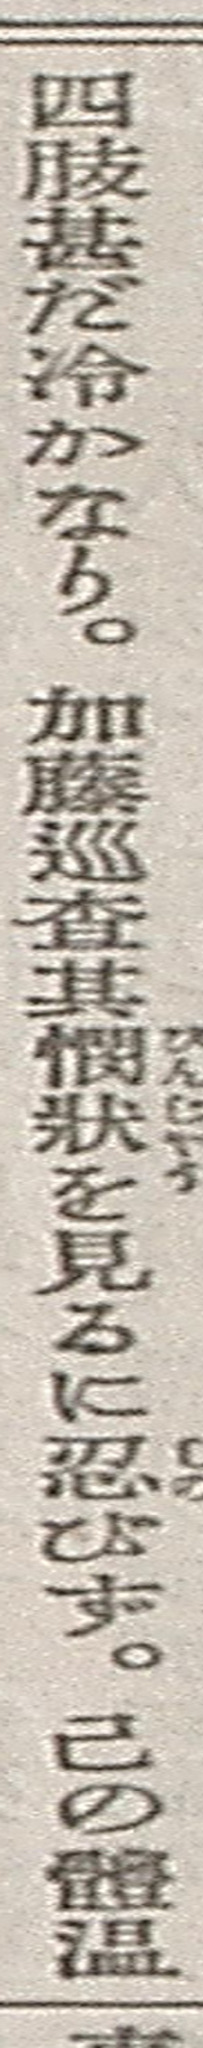四肢甚だ冷かなり。加藤巡査其憫状を見るに忍びず。己の体温
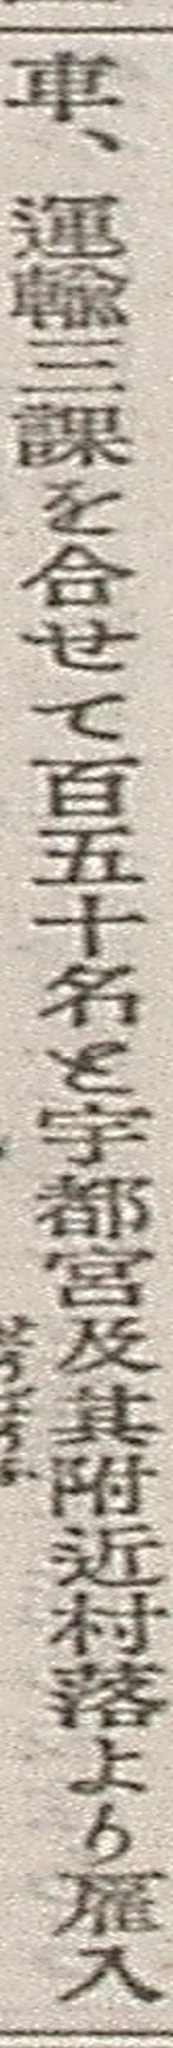車、運輸三課を合せて百五十名と宇都宮及其附近村落より雇入
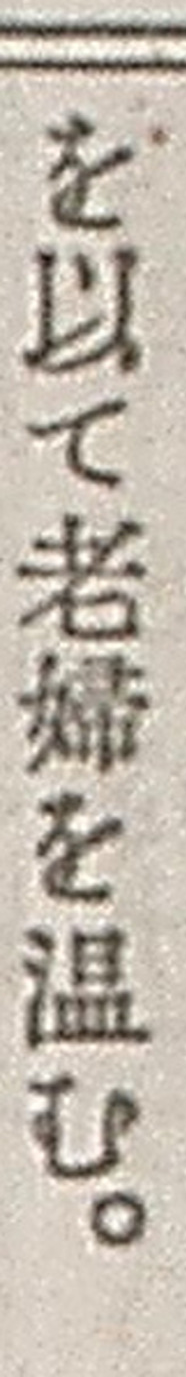を以て老婦を温む。
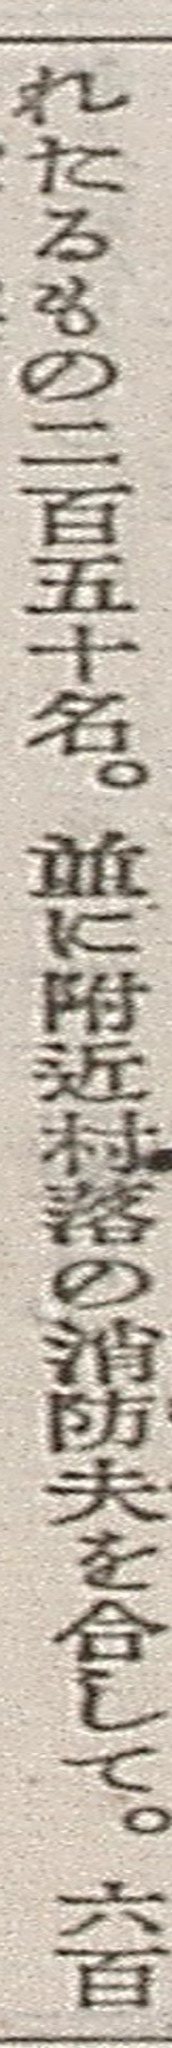れたるもの二百五十名。並に附近村落の消防夫を合して。六百
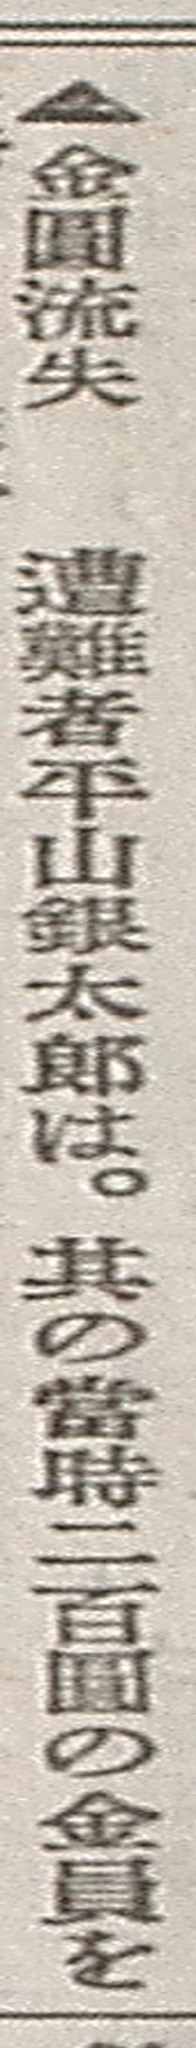▲金円流失遭難者平山銀太郎は。其の当時二百円の金員を
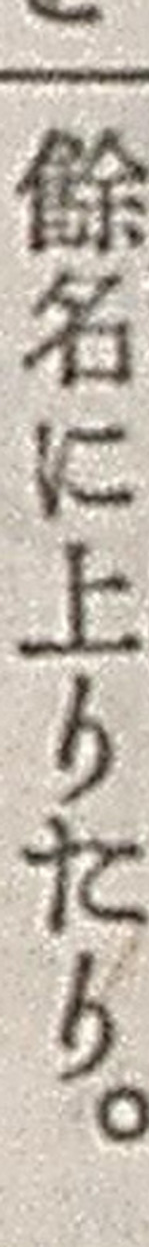余名に上りたり。
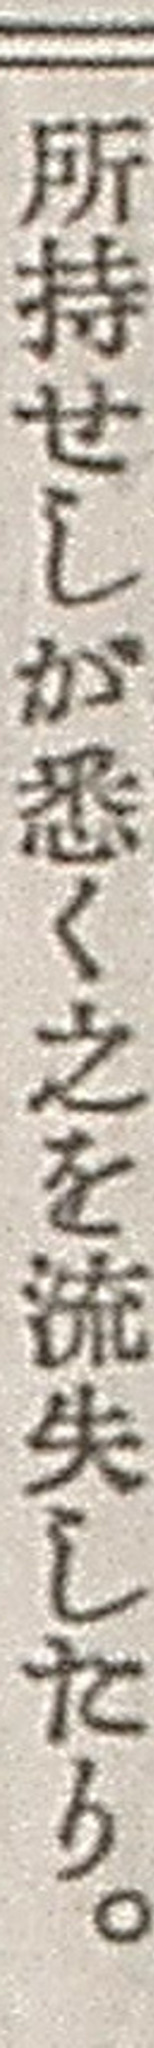所持せしが悉く之を流失したり。
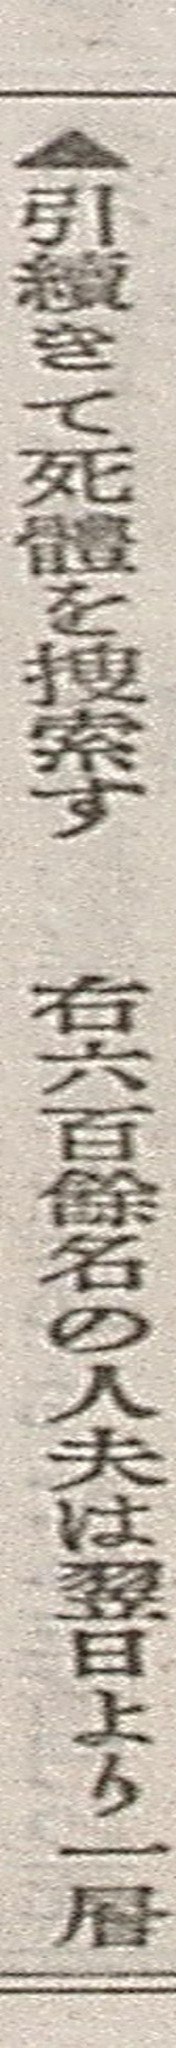▲引続きて死体を捜索す右六百余名の人夫は翌日より一層
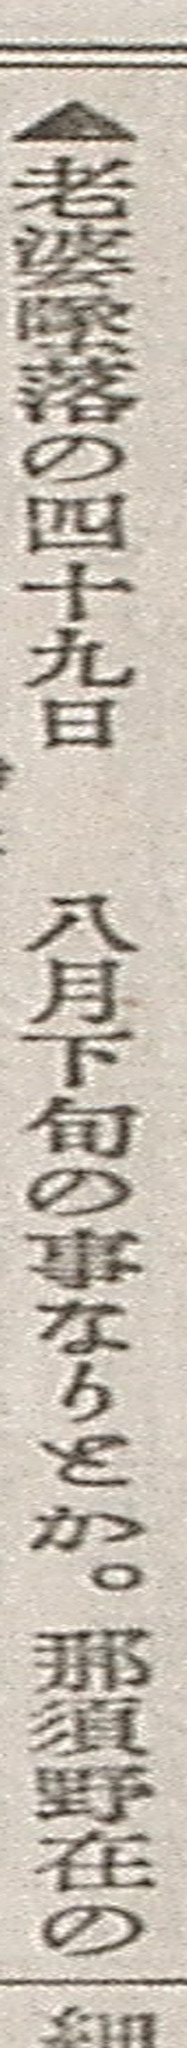▲老婆墜落の四十九日八月下旬の事なりとか。那須野在の
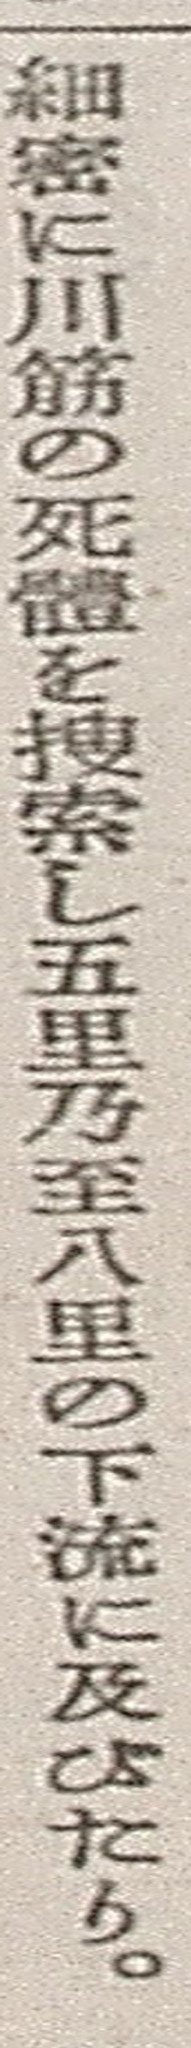細密に川筋の死体を捜索し五里乃至八里の下流に及びたり。
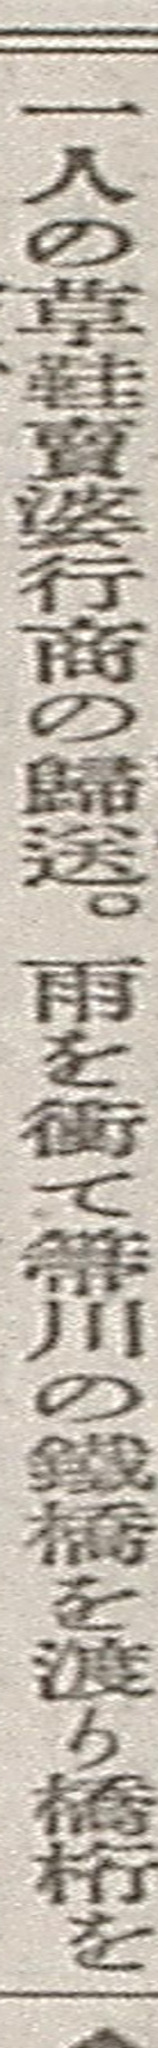一人の草鞋売婆行商の帰送。雨を衝て箒川の鉄橋を渡り橋桁を
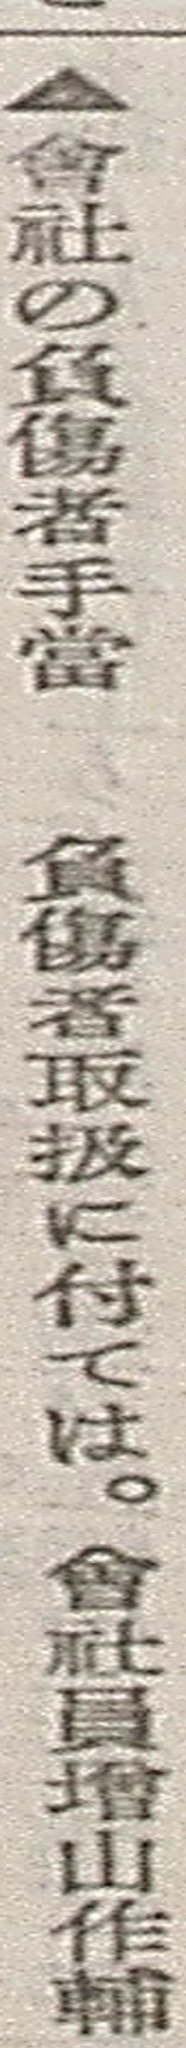▲会社の負傷者手当負傷者取扱に付ては。会社員増山作輔
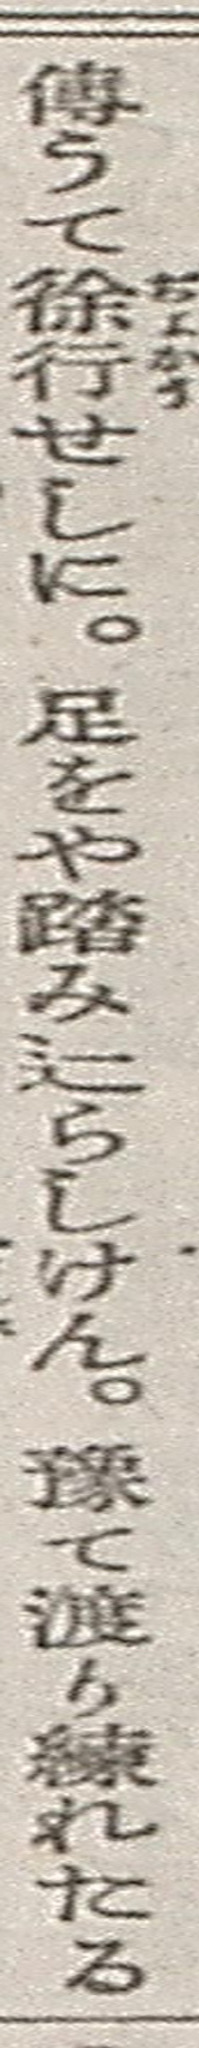伝うて徐行せしに。足をや踏み辷らしけん。豫て渡り練れたる
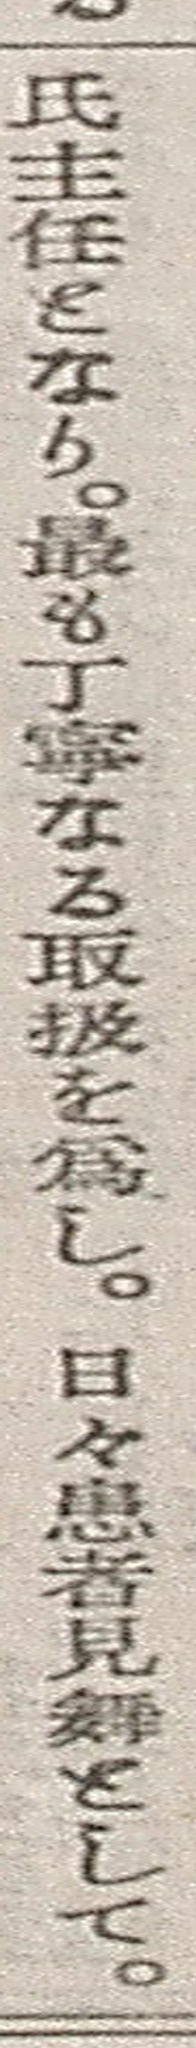氏主任となり。最も丁寧なる取扱を為し。日々患者見舞として。
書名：風俗畫報臨時増刊第百九十九號　明治三十二年十月各地災害圖會（前編之續）
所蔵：東京大学地震研究所図書室 Earthquake Research Institute Library, The University of Tokyo, JAPAN
